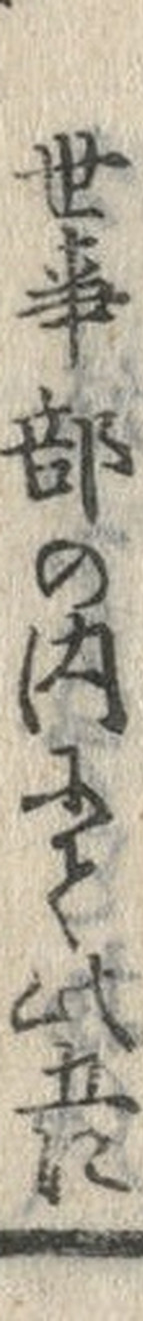世事部の内にて此五に
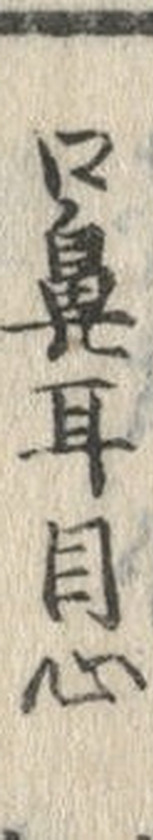口鼻耳目心
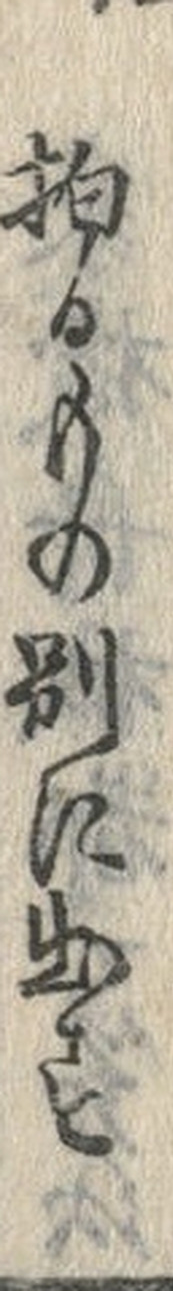拍るもの別に出す

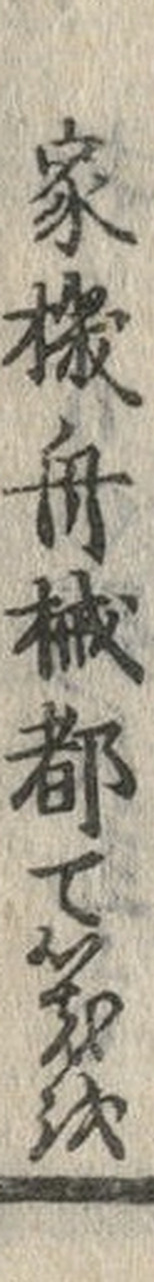家機舟械都て器財を
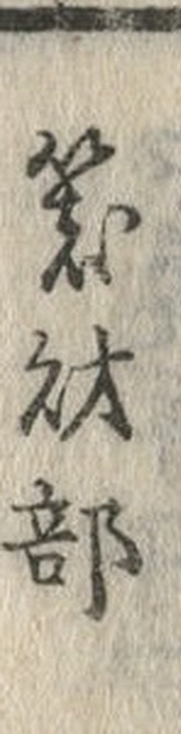器財部
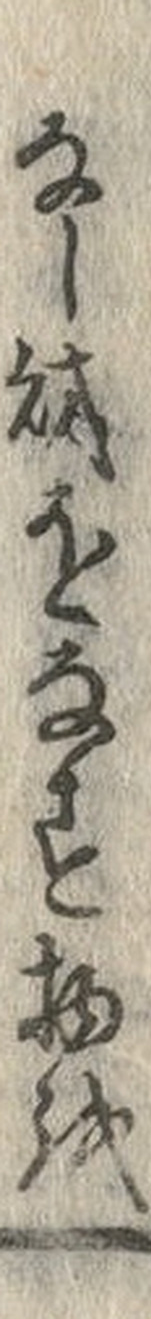なし財をなす物を
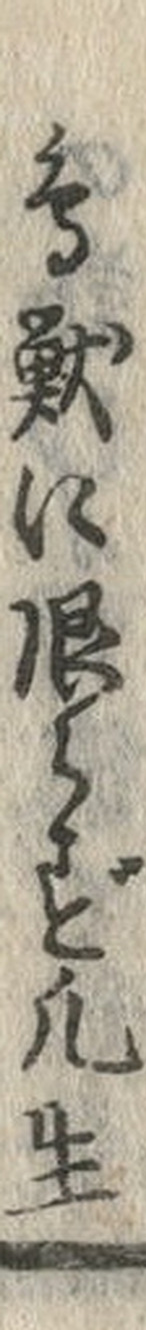鳥獣に限らず凢生
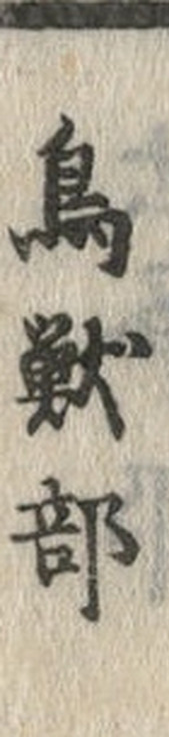鳥獣部
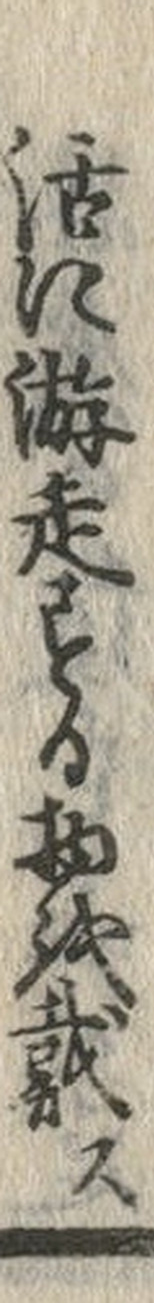活に游走する物を戴
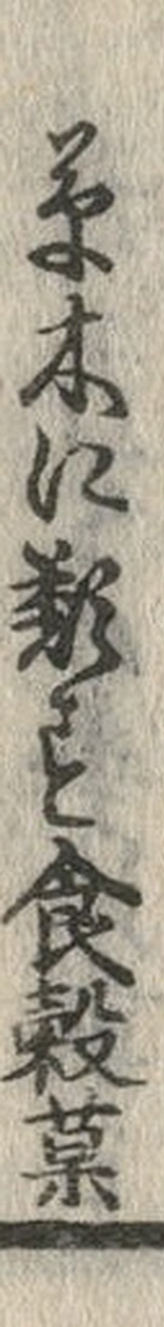草木に類す食穀菓
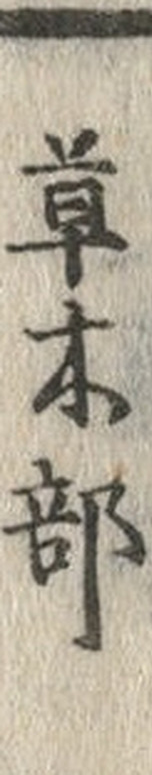草木部
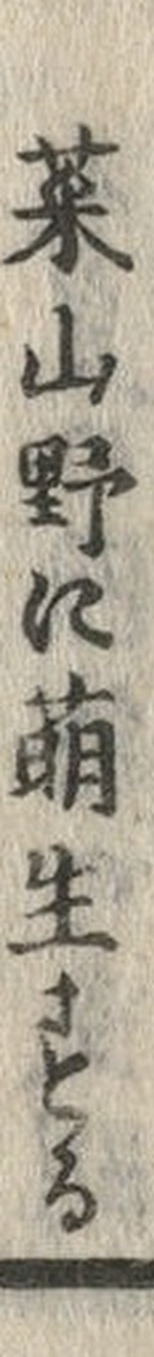菜山野に萌生する
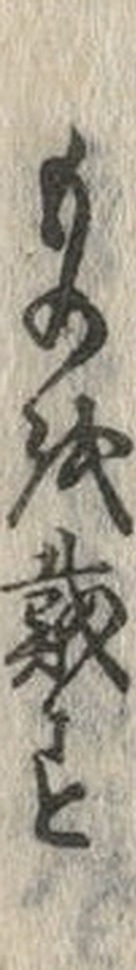ものを戴す
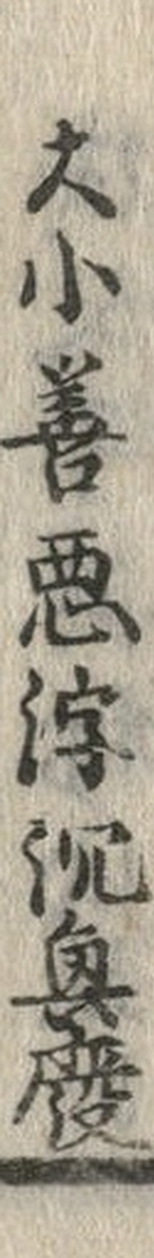大小善悪沉浮沈興廃
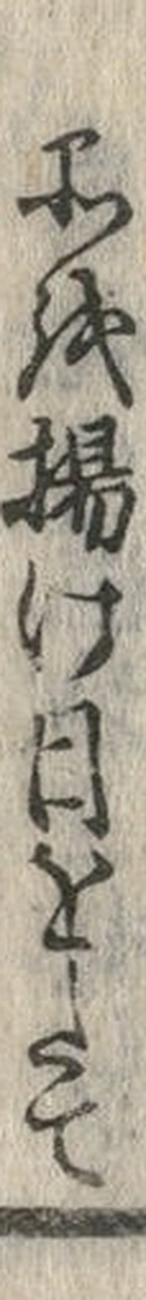品を揚け目？をたて
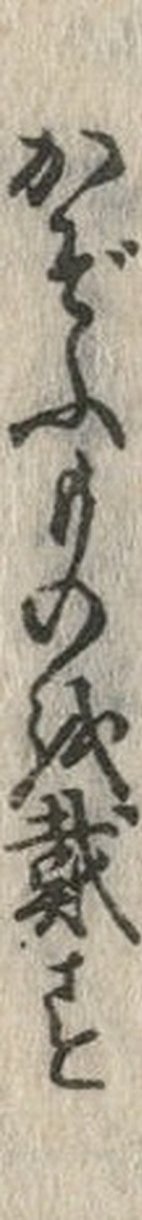かぞふものを戴す
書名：蝦夷方言藻汐草　乾巻
